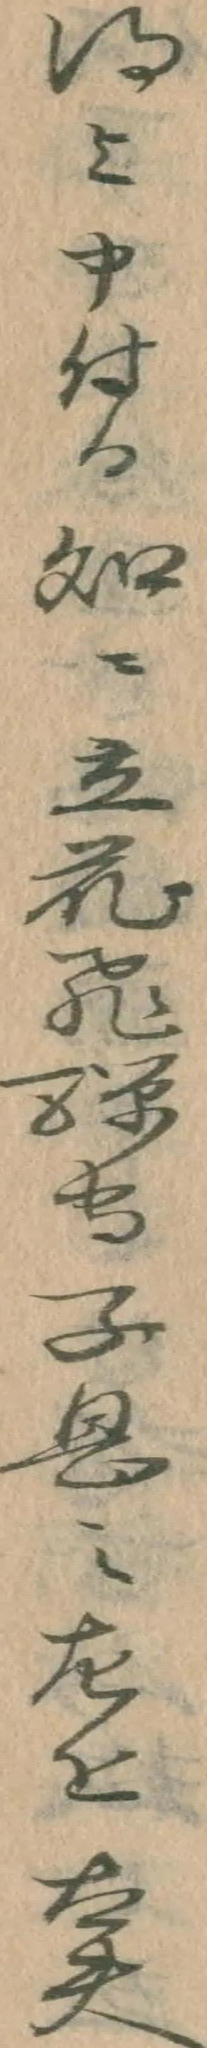得与申付る処に立花飛騨守子息之左近太夫
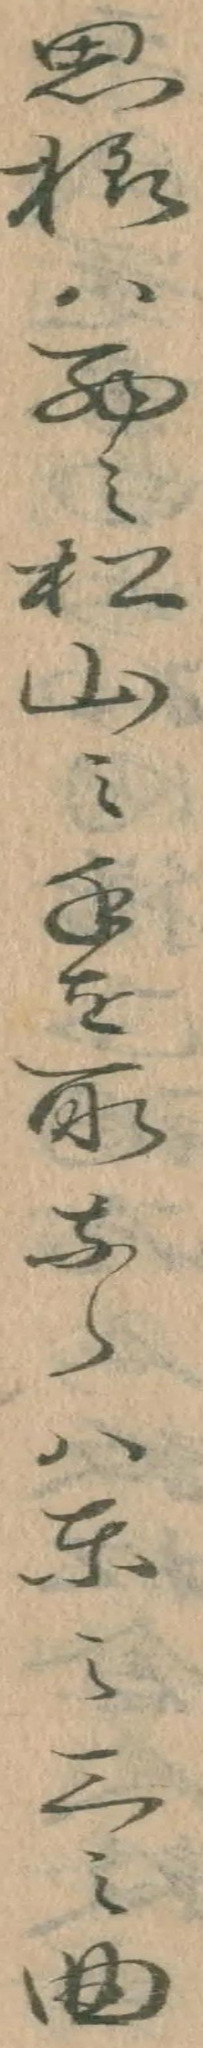思様は西之松山之手を取ならは東之三之曲
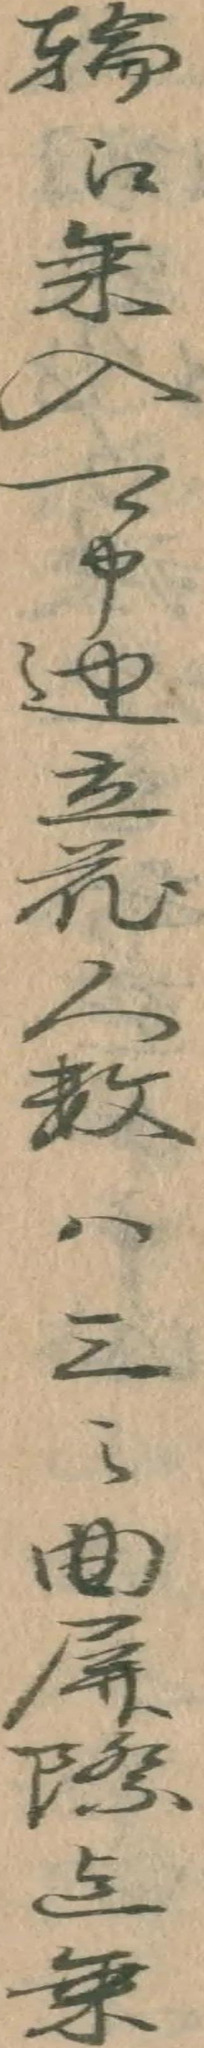輪江乗入可申迚立花人数は三之曲屏際迄乗
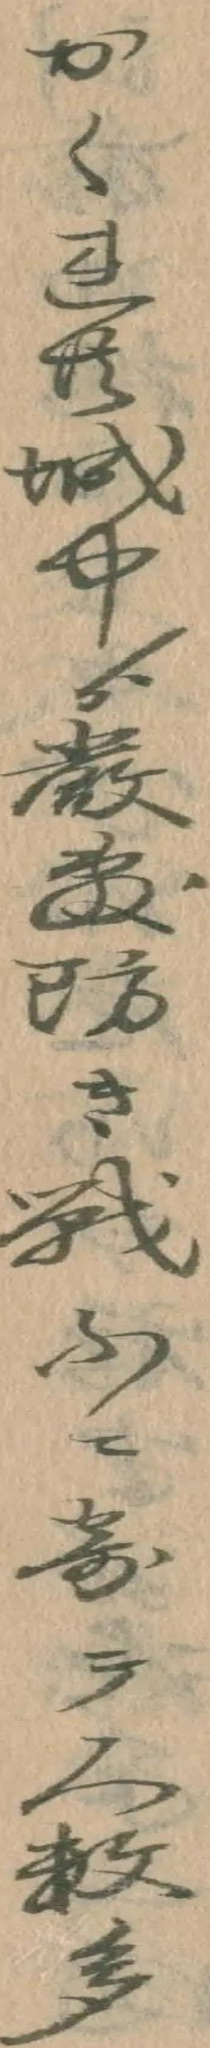かく連共城中ゟ厳敷防き戦ふに寄て人数多
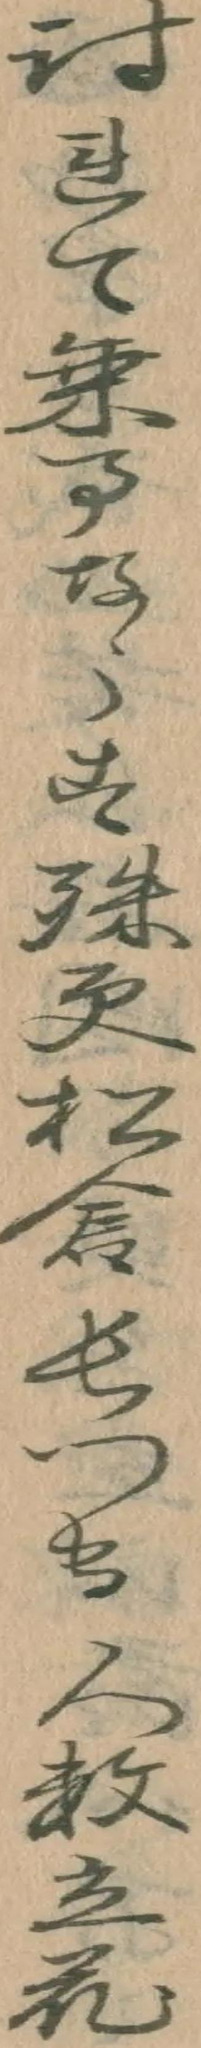討連て乗事なら春殊更松倉長門守人数立花
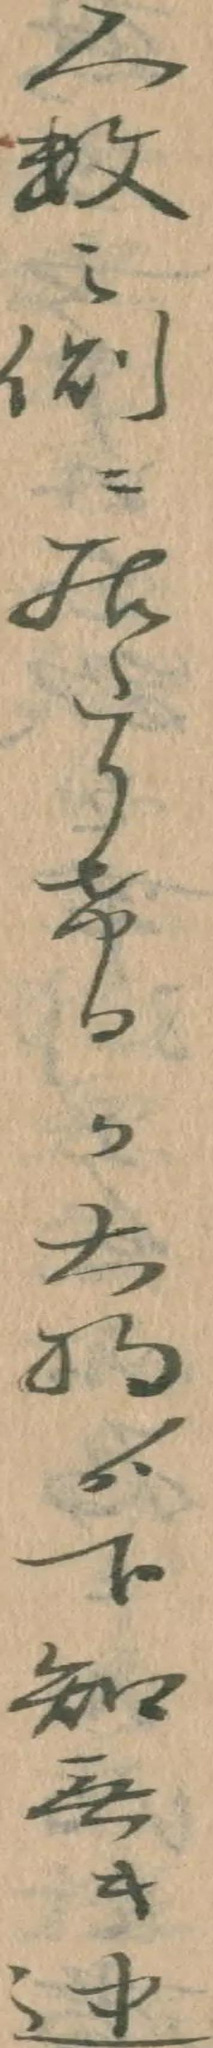人数之例に居たり希るか大将ゟ下知無き迚
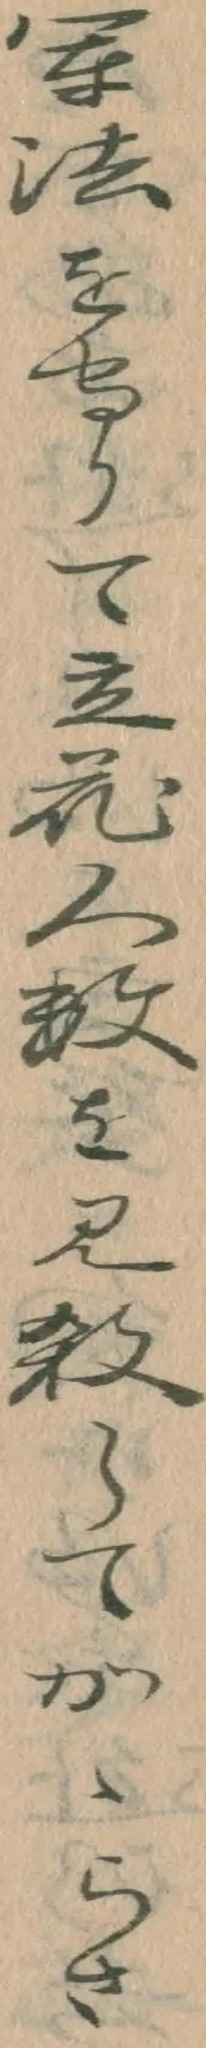軍法を守りて立花人数を見殺してかゝらさ
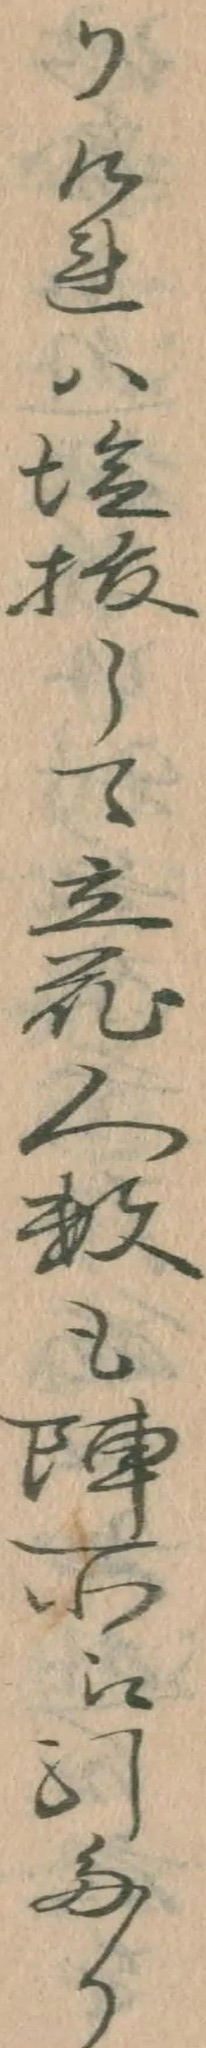りけ連は塩抜して立花人数も陣所江引多り
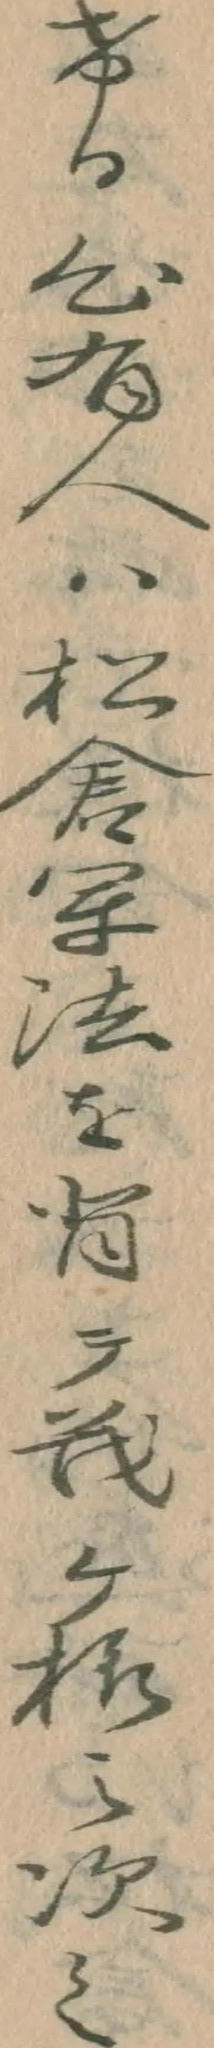希る心有人は松倉軍法を背て茂け様之次く
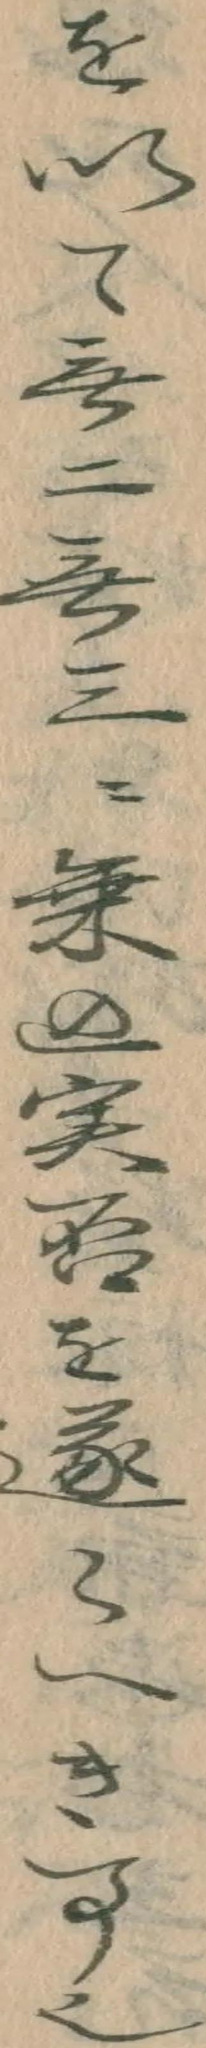を以て無二無三に乗込実否を遂らへき事也
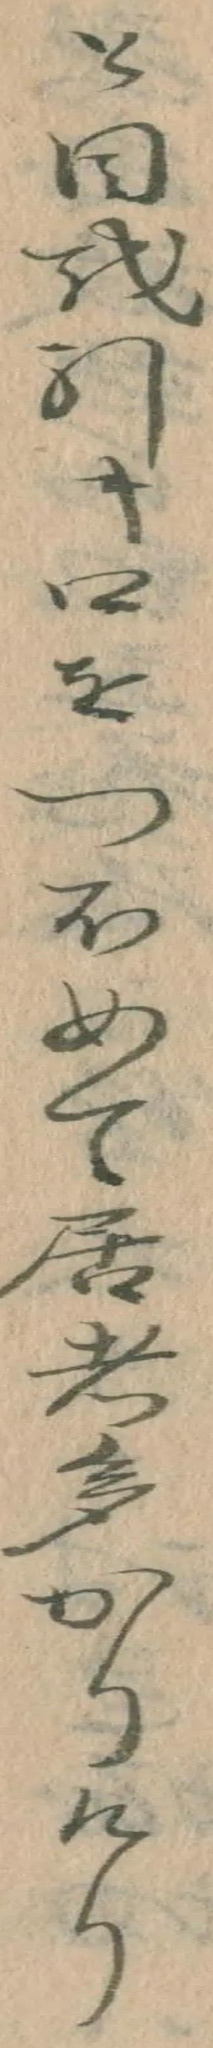と目越引き口をつ不めて居者多かりけり
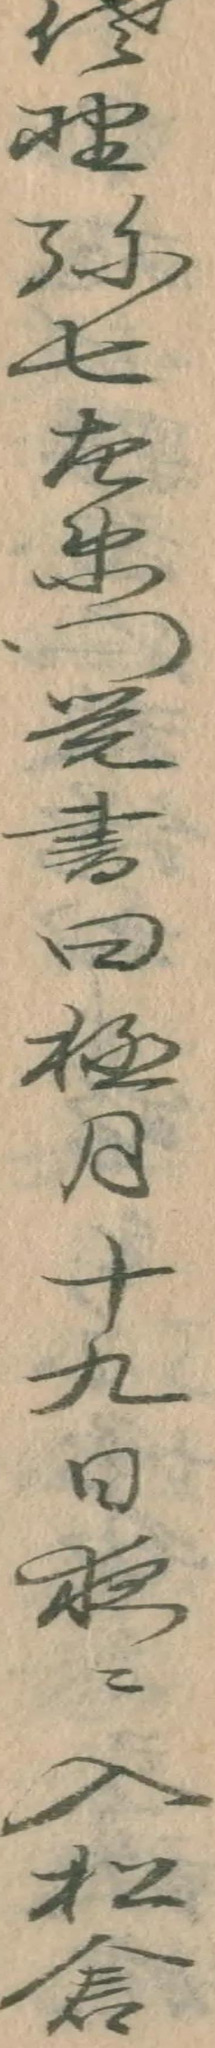佐野弥七左衛門覚書曰極月十九日夜に入松倉
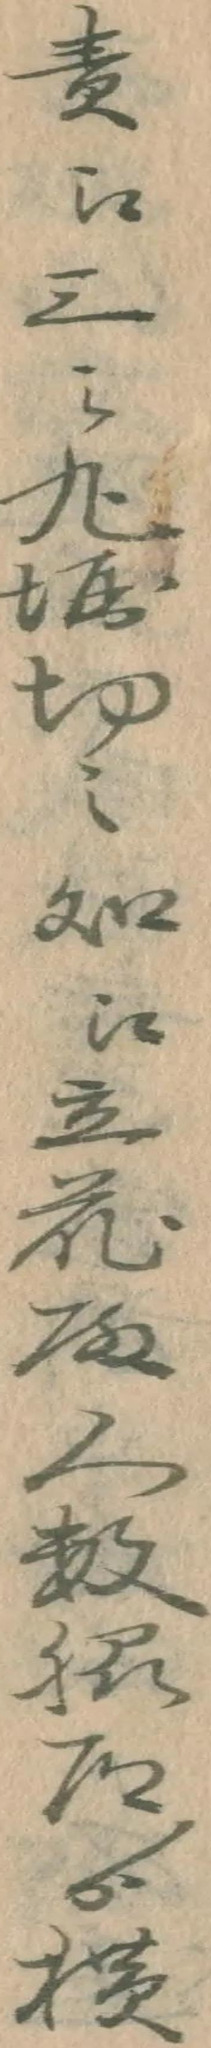責江三之丸堀切之処江立花殿人数脇道ゟ横
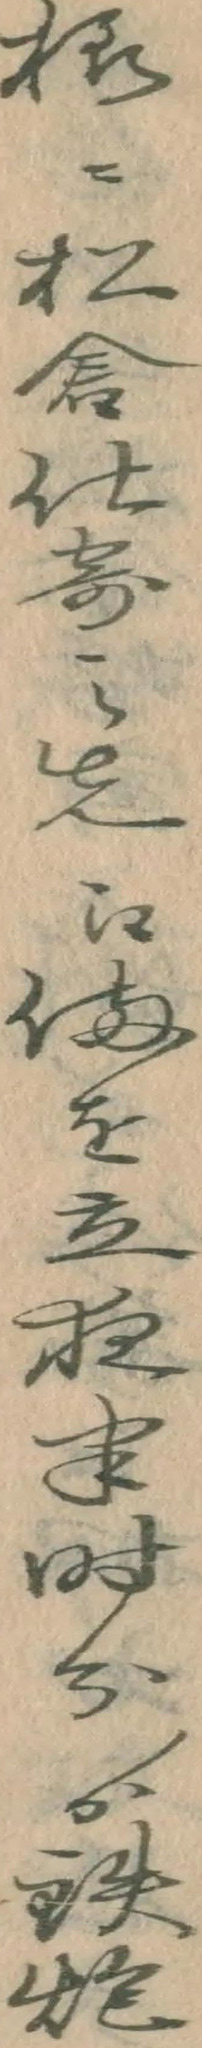様に松倉仕寄之先江備を立夜半時分ゟ鉄炮
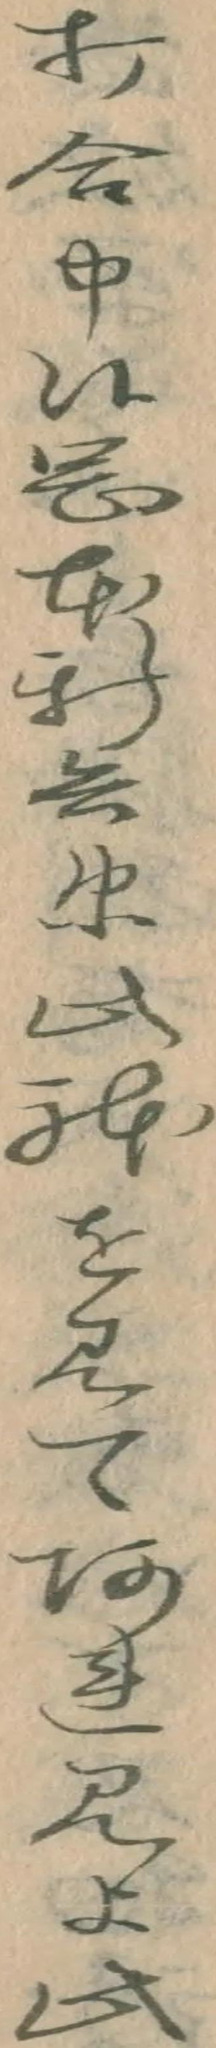打合申候岡本新兵衛此躰を見て阿連見よ此
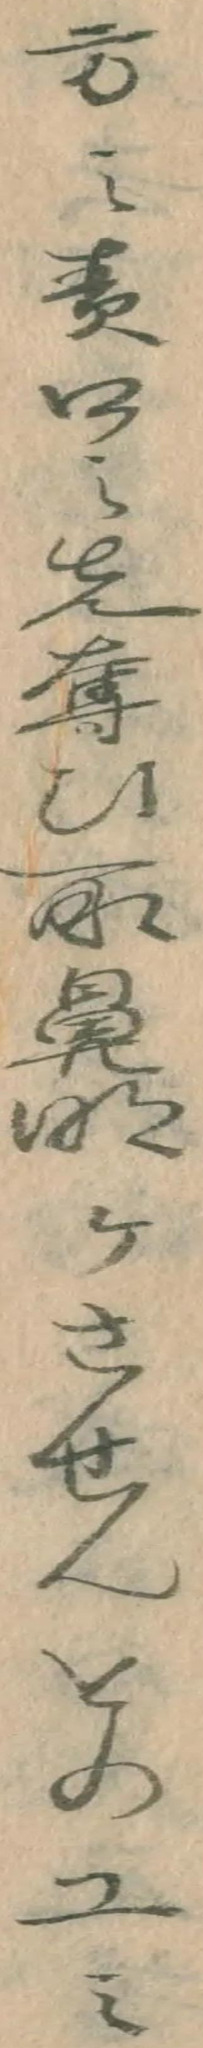方之責口之先奪ひ取鼻明けさせんとの工之
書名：切支丹御退治記 49巻. [4]
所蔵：国立国会図書館 National Diet Library, JAPAN
